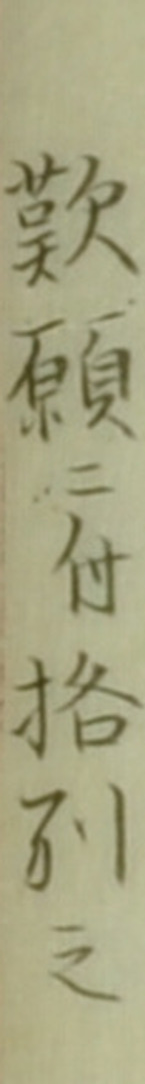歎願ニ付格別之
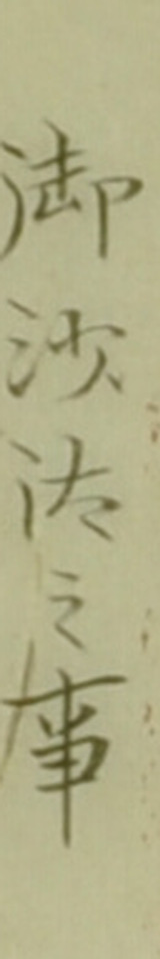御沙汰之事
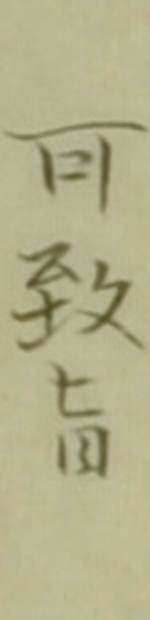可致旨
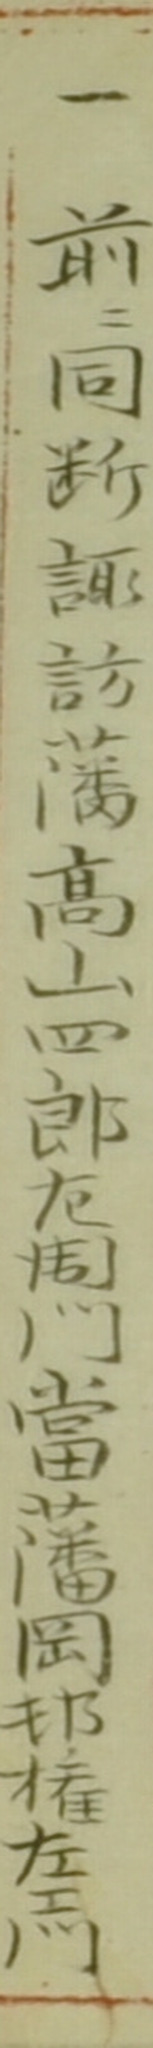一前ニ同断諏訪藩高山四郎左衛門當藩岡邨権左衛門
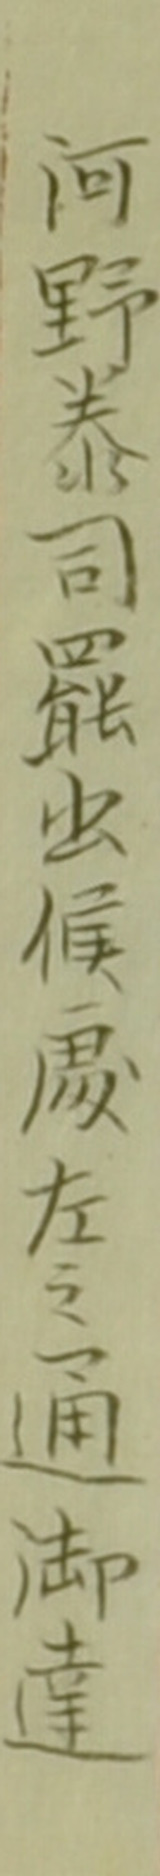河野泰司罷出候処左之通御達
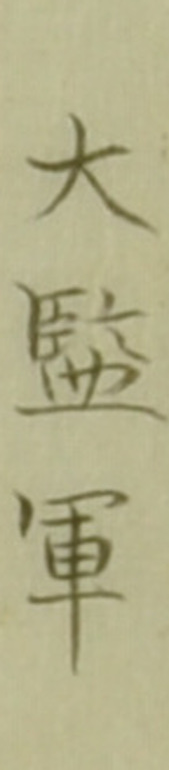大監軍
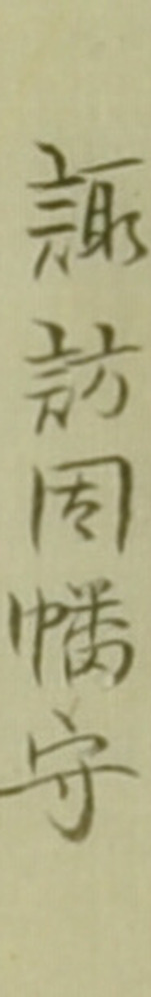諏訪因幡守
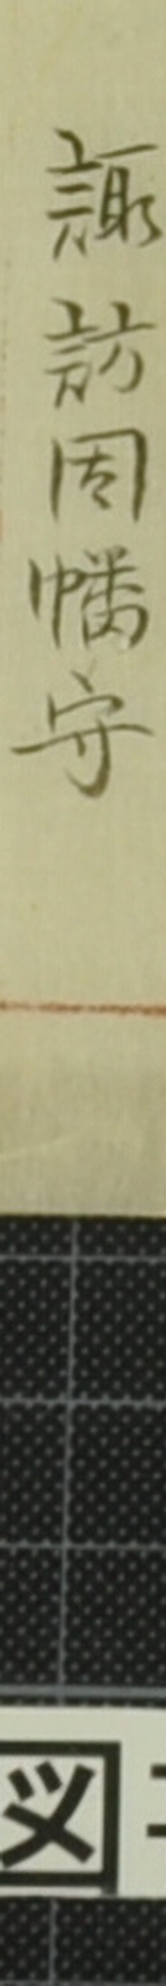諏訪因幡守
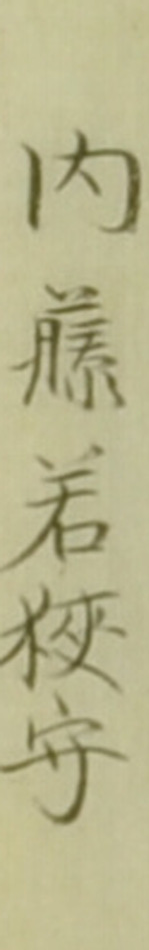内藤若狭守

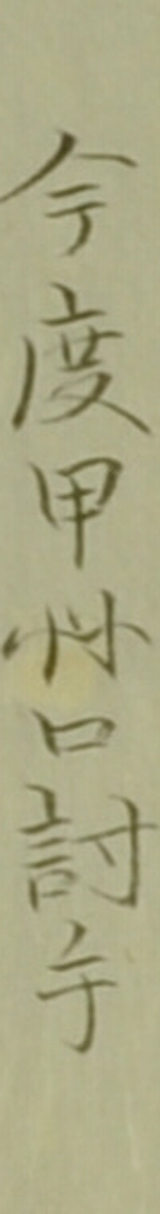今度甲州口討手
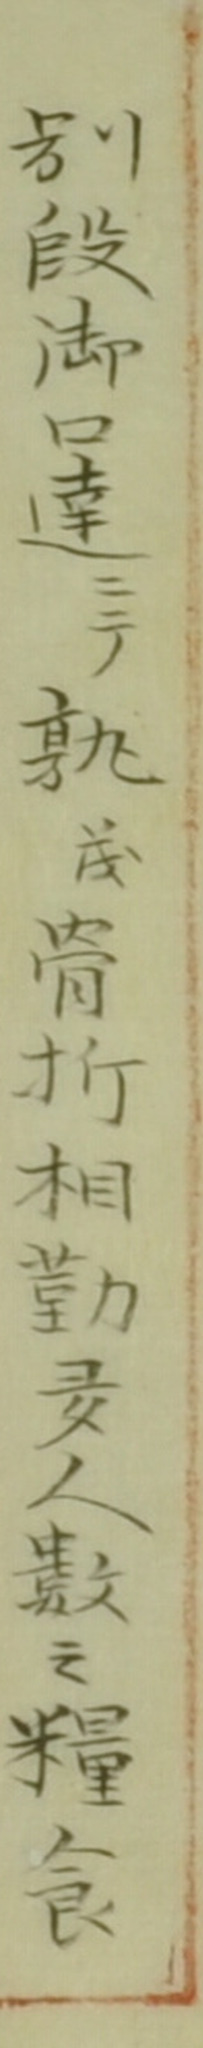一別段御口達ニテ孰茂骨折相勤多人数之糧食
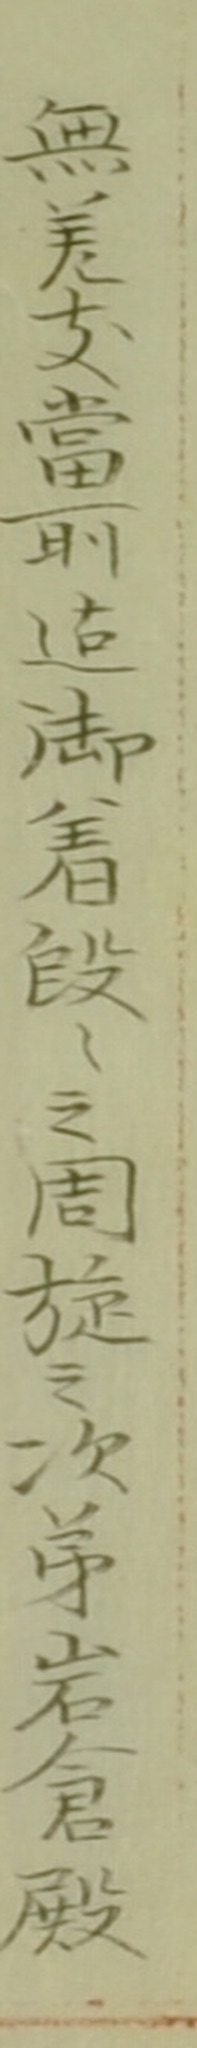無差支当前迄御着段〻之周旋之次第岩倉殿
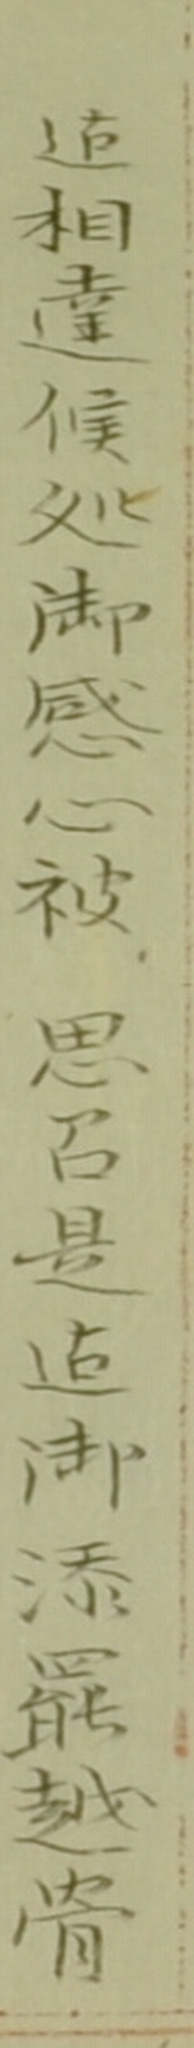迄相達候処御感心被思召是迄御添罷越骨
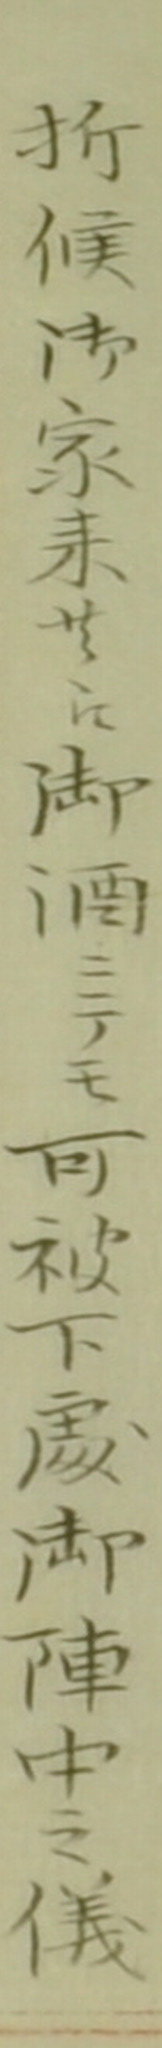折候御家来共江御酒ニテモ可被下処御陣中之儀
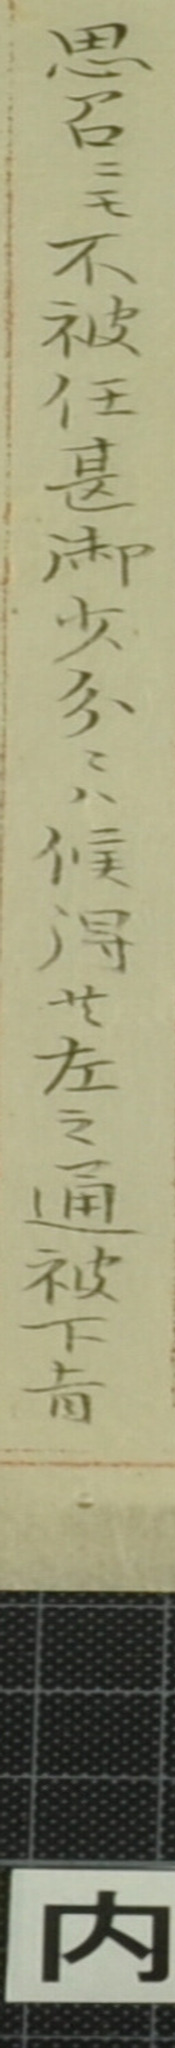思召ニモ不被任甚御少分ニハ候得共左之通被下旨
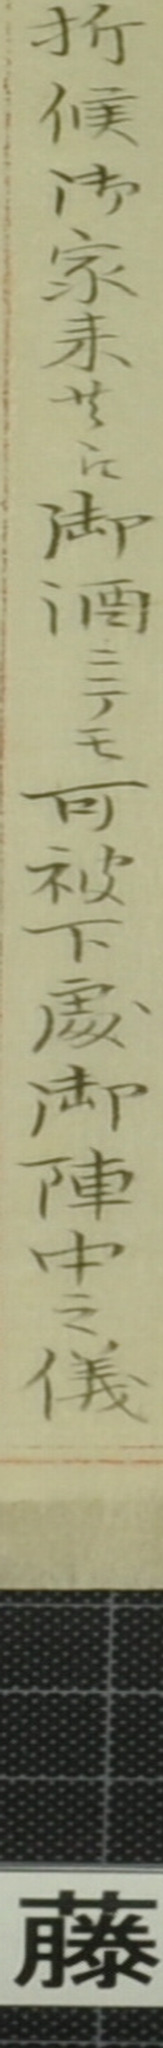折候御家来共江御酒ニテモ可被下処御陣中之儀
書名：御東征ニ付甲州口兵食人馬御賄之事件（控）
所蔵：伊那市立高遠町図書館・合同会社AMANE
